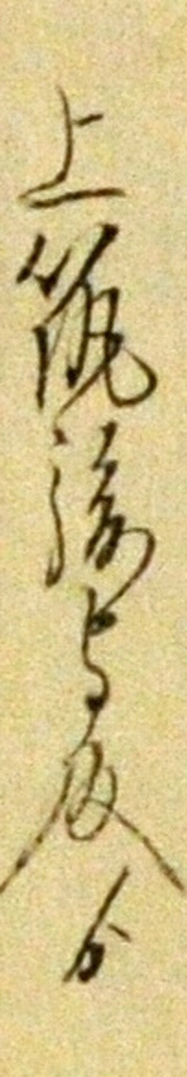上筑後守殿ゟ
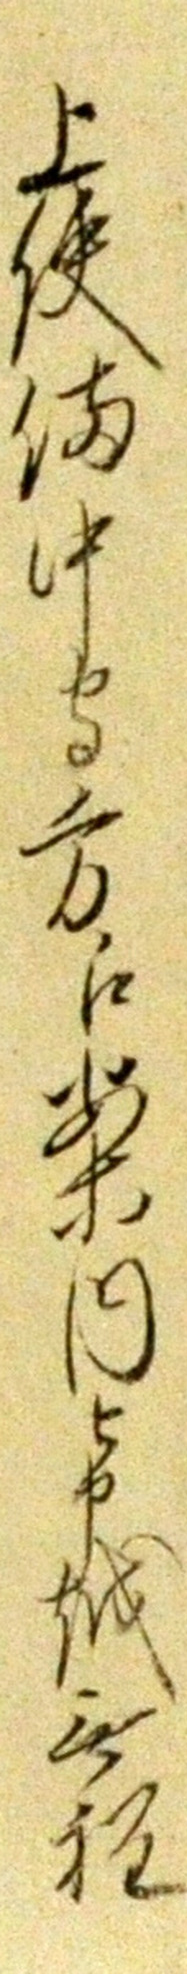上使備中守方え案内被申越無程
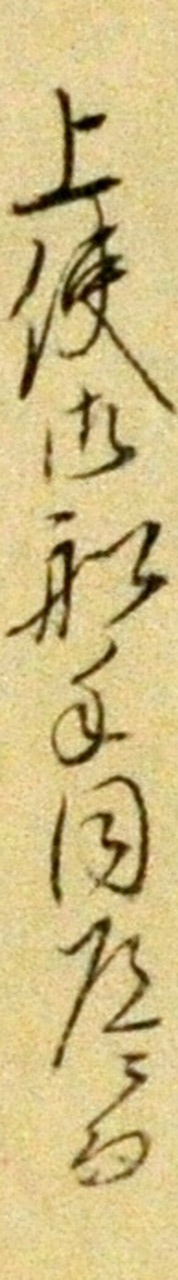上使御船手同道ニ而
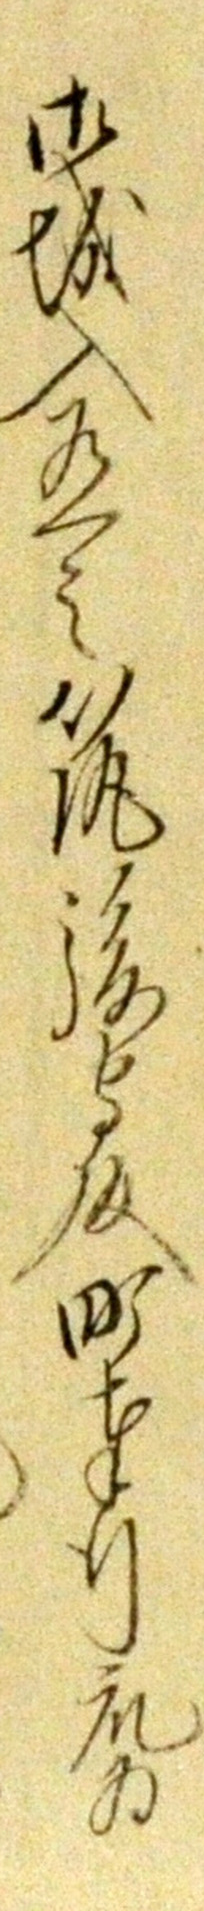御城入有之筑後守殿町奉行衆為
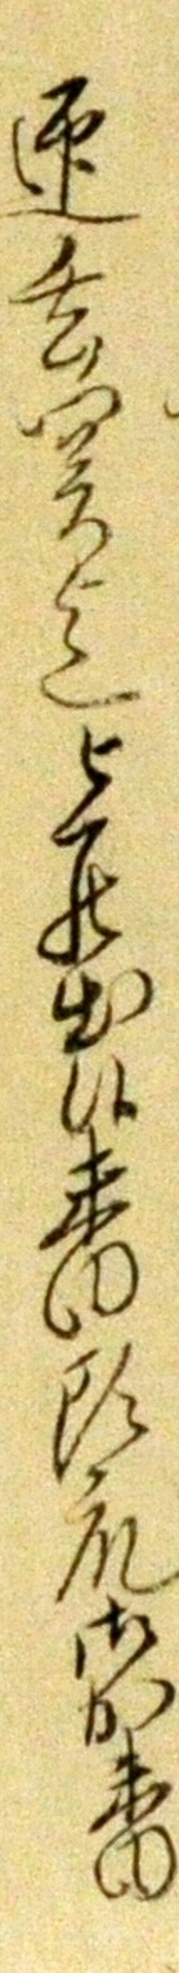迎玄関迄被罷出候番頭衆御加番
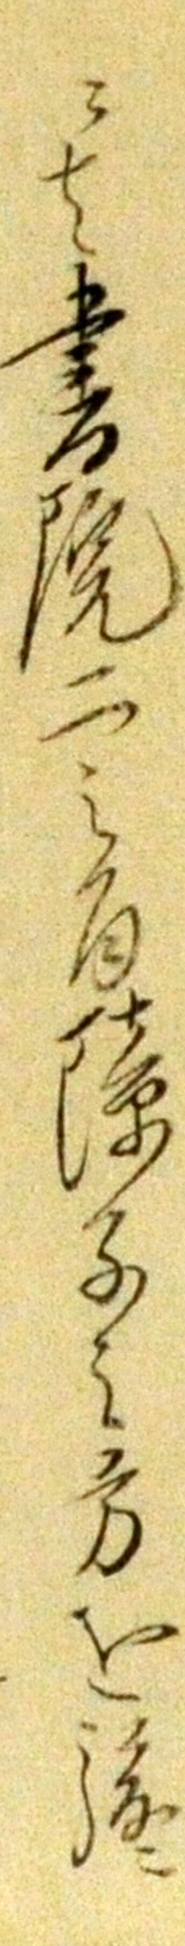ニは書院二之間障子之方を後ニ
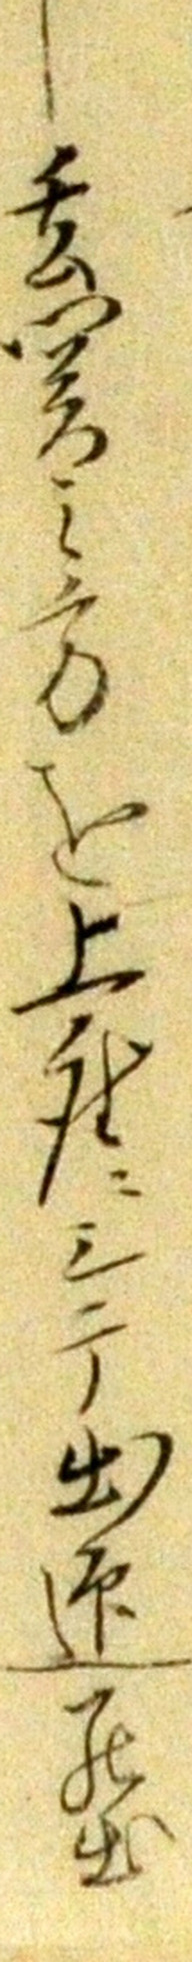し玄関之方を上座ニシテ出迎罷出
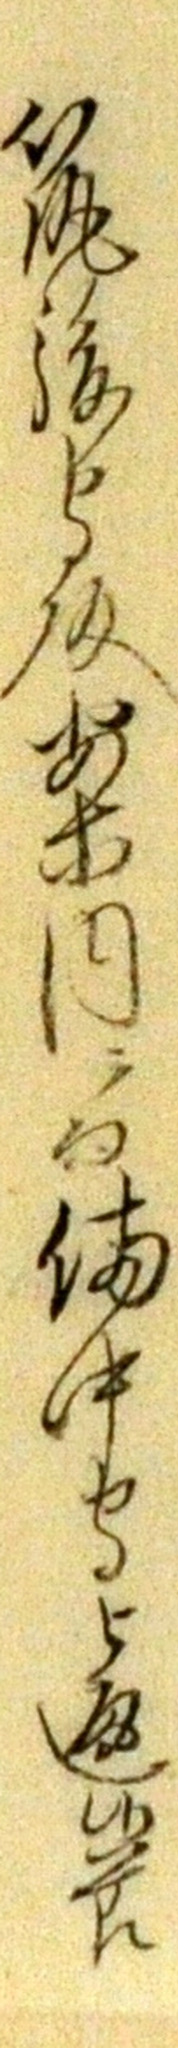筑後守殿案内ニ而備中守被通候節
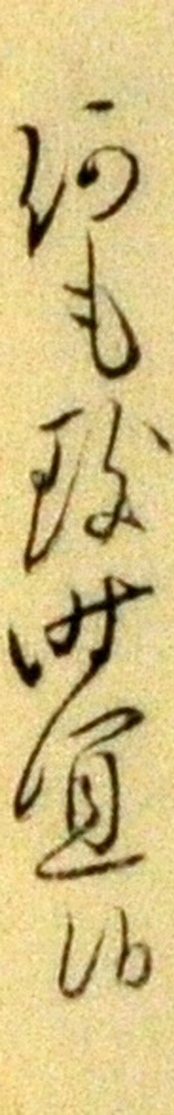何も致時宜候
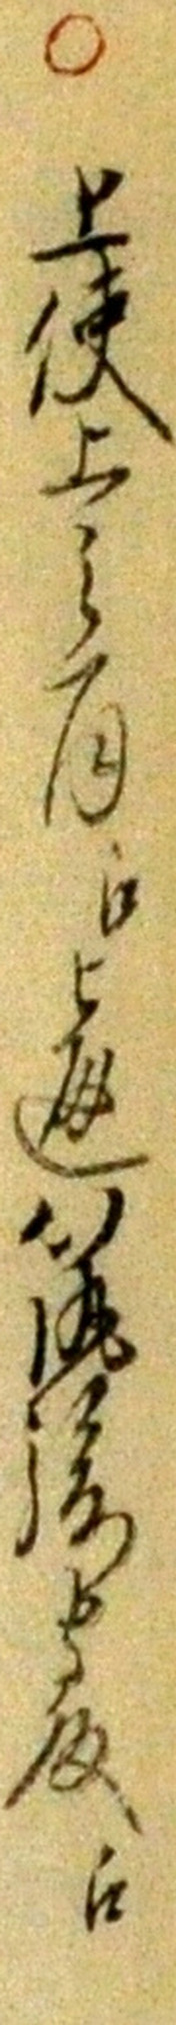上使上之間え被通筑後守殿え
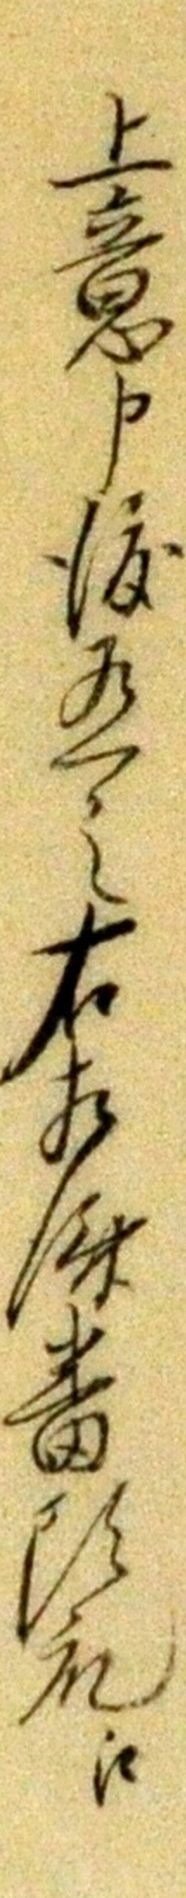上意申渡有之右相済番頭衆え
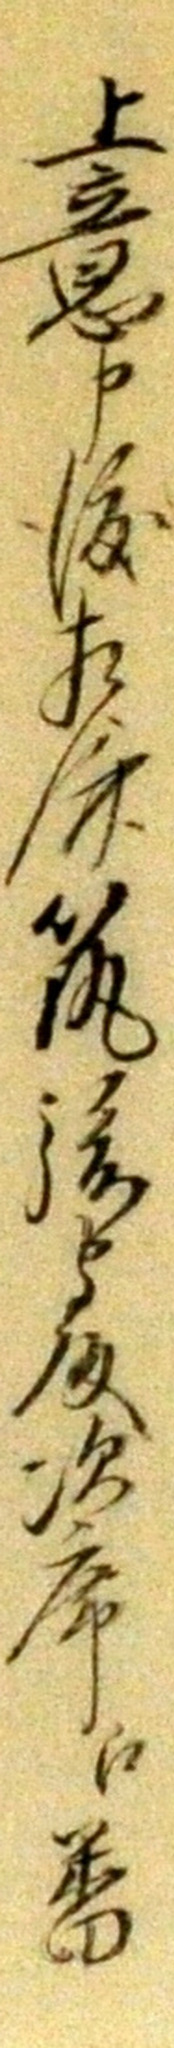上意申渡相済筑後守殿次席え番
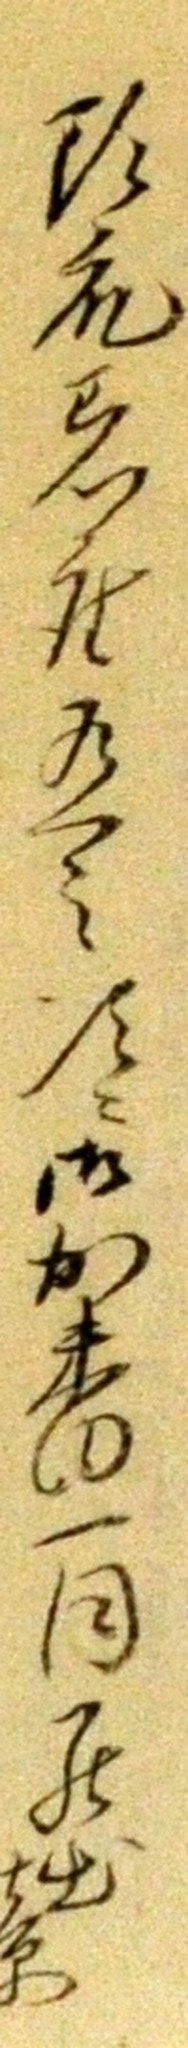頭衆着座有之順ニ御加番一同罷出障
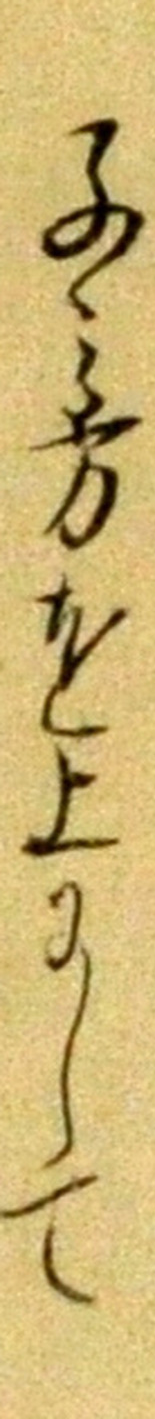子之方を上にして
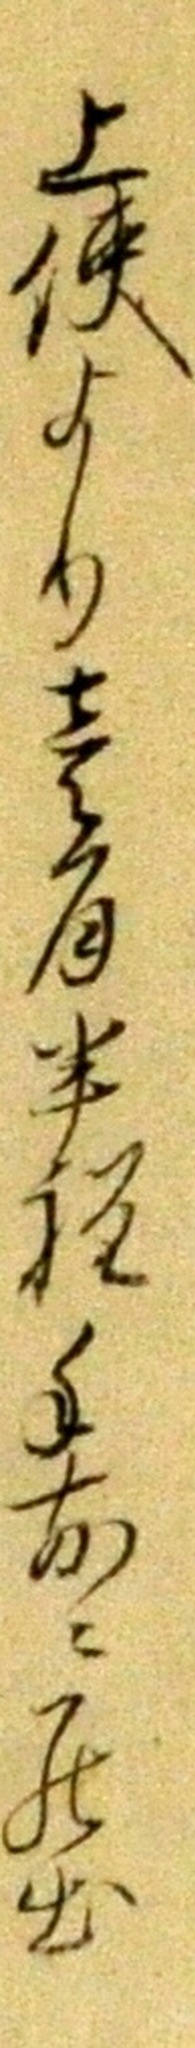上使より壱間半程手前ニ罷出
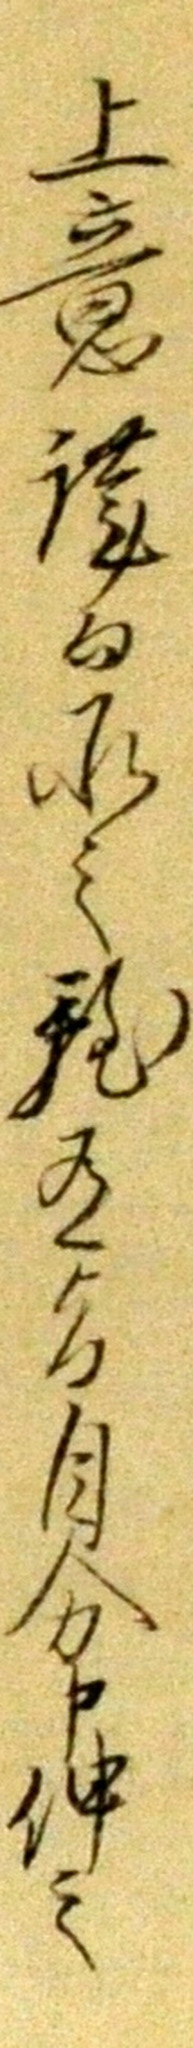上意謹而承之難有旨自分申伸之
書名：大阪加番関係諸書留〔一括〕
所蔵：伊那市立高遠町図書館・合同会社AMANE
